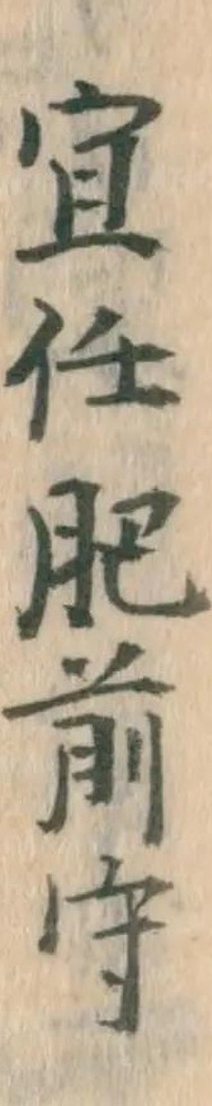宜任肥前守
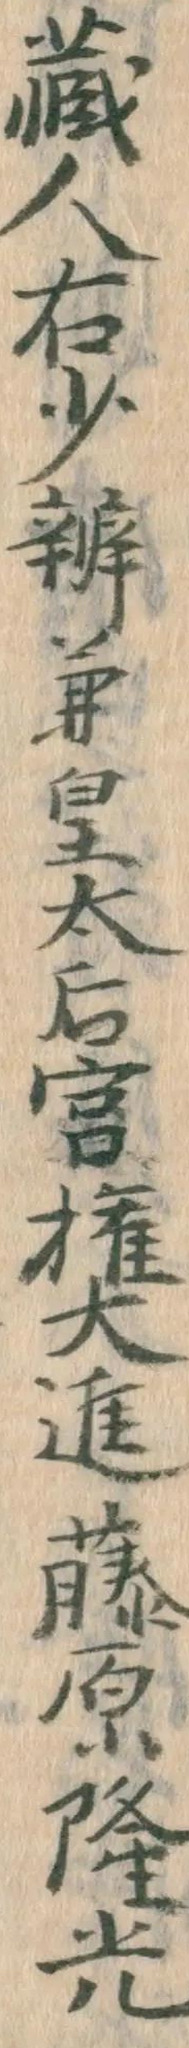蔵人右少辨兼皇太后宮権大進藤原隆光奉
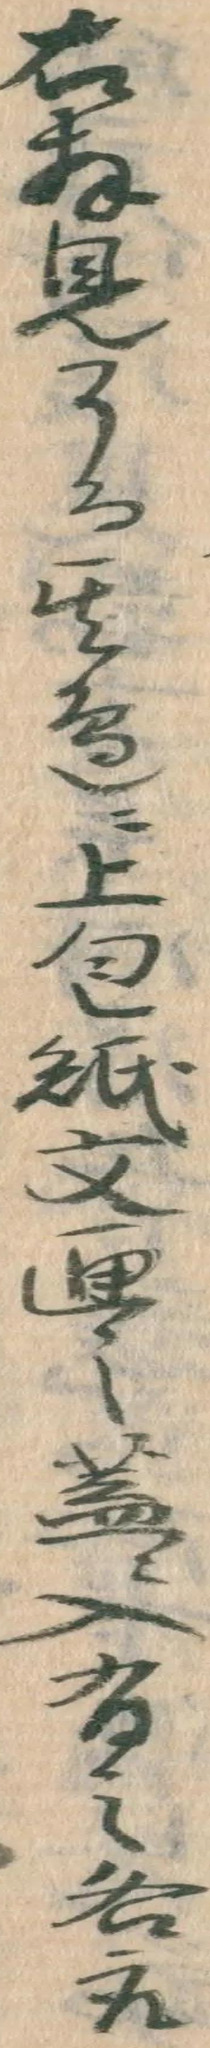右拝見了而、其辺ニ上包紙文匣之蓋ニ入有之、各取
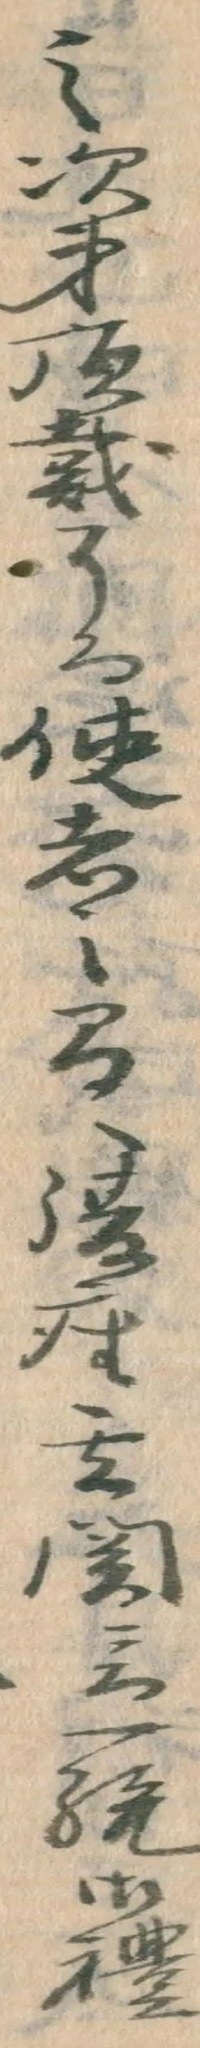之次第頂戴了而、使者之間へ復座、玄関ニ而一統御礼
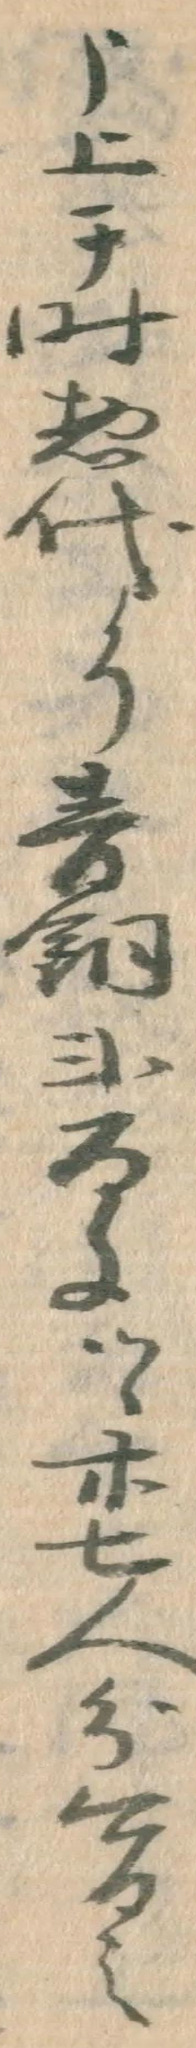申上、于時惣代より青銅弐百文ツヽ廿七人分、今日之
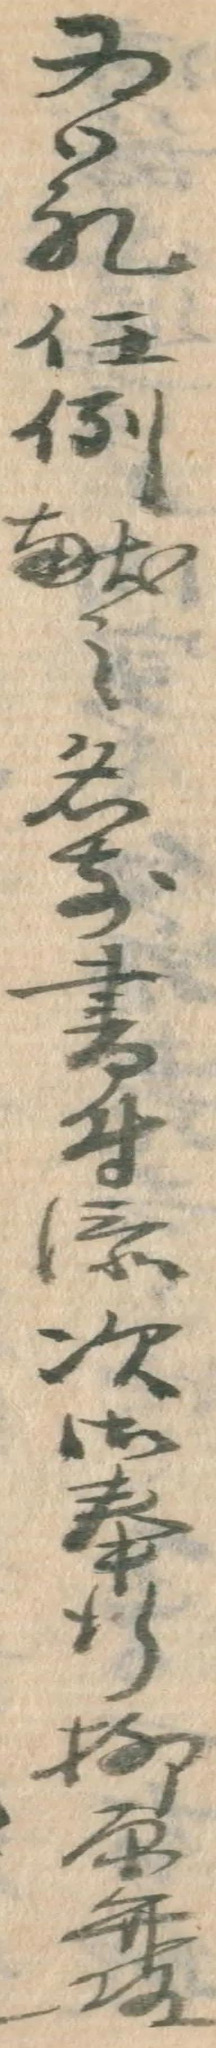為御礼、任例献之、名前書付添、次御奉行柳原弁殿
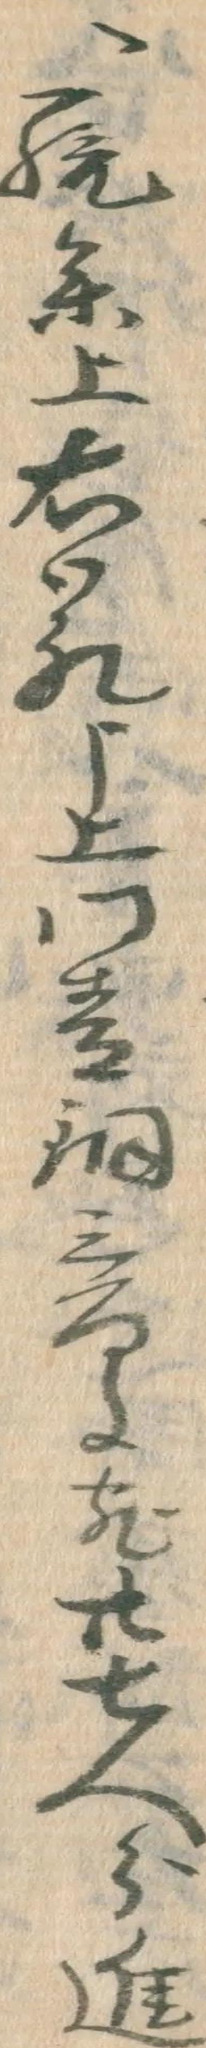へ罷参上、右御礼申上、同青銅三百文宛廿七人分進
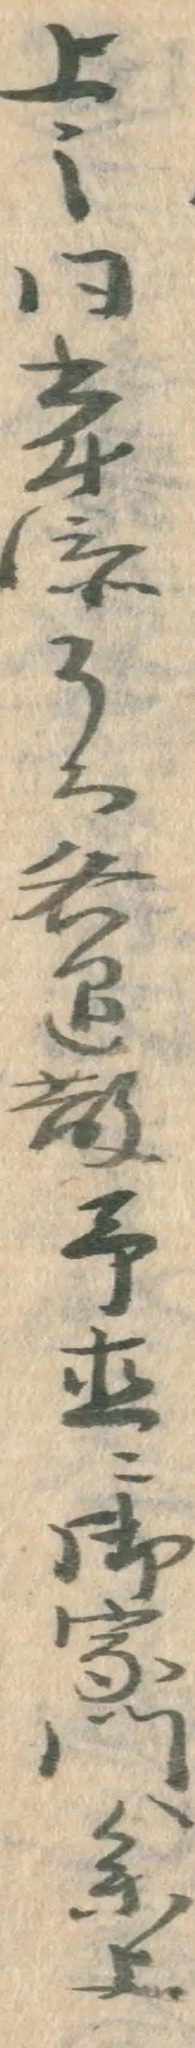上之、同書付添了而各退散、予直に御家門へ参上、
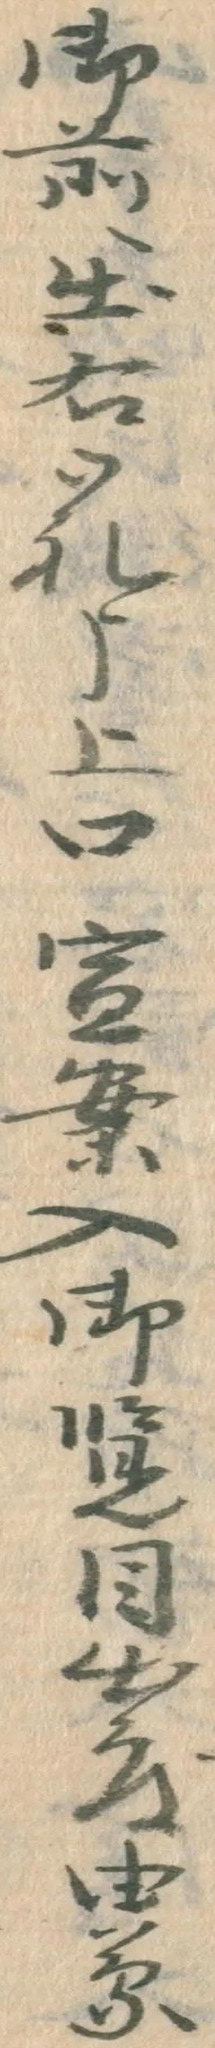御前へ出、右御礼申上、口宣案入御覧、目出度由蒙
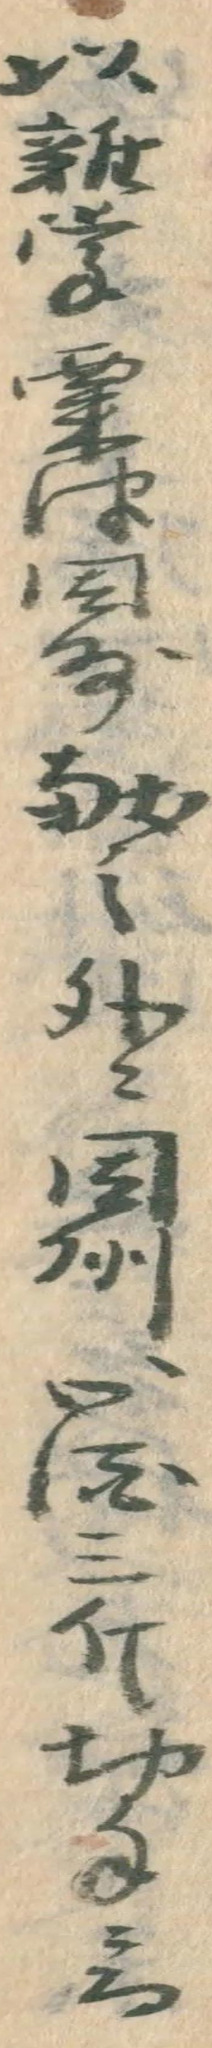以雑掌粟津因州、献之外ニ、因州へ御渡三斤、切手ニ而

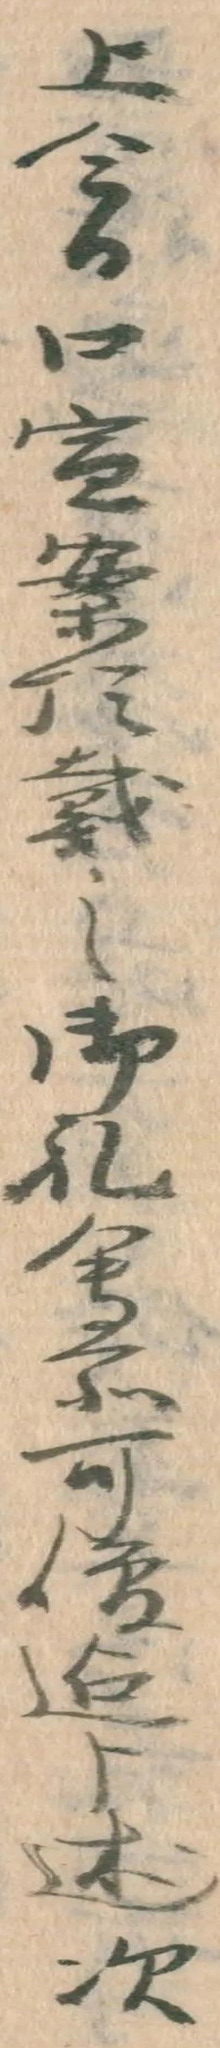上、今日口宣案頂戴之御礼、會所可俊迄申述、次
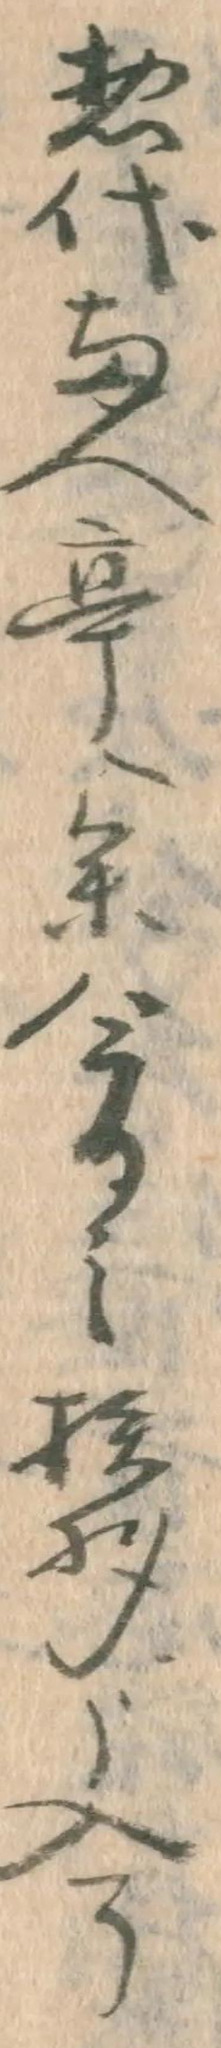惣代両人亭へ参、今日之挨拶申入了、
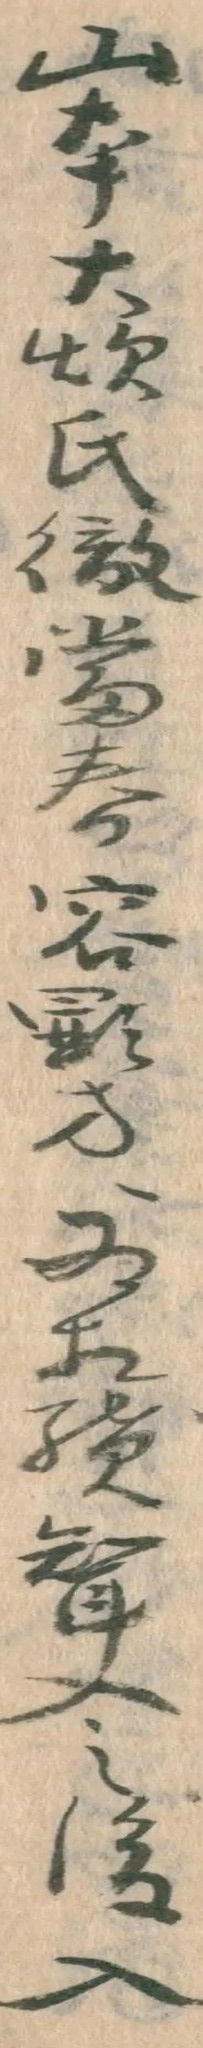山本大炊氏徹、當春容顕方へ為相続聟入之後、入
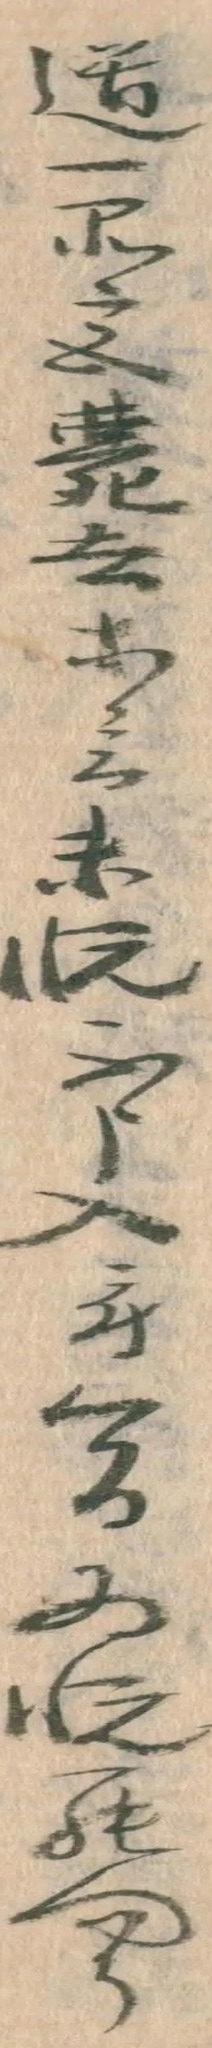道一品宮薨去等ニ而未不申入ニ付、今日為罷向了、
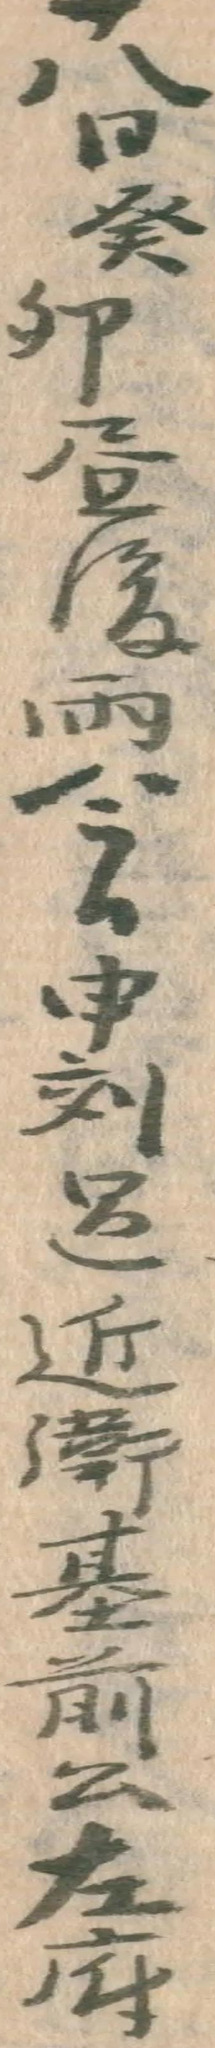十八日癸申昼後雨、今日申刻過、近衛基前公左府
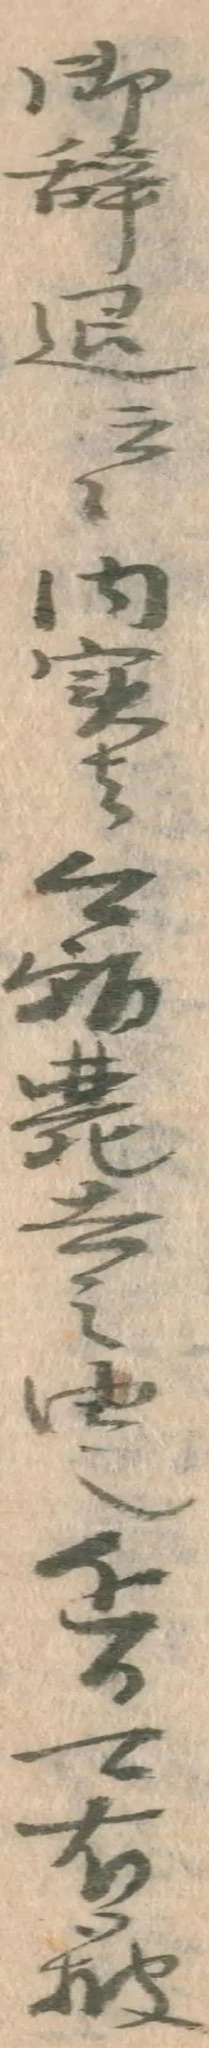御辞退云々、内実者、今朝薨去之由也、近日可有御披
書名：賀茂社記録. 第63冊
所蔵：国立国会図書館 National Diet Library, JAPAN
